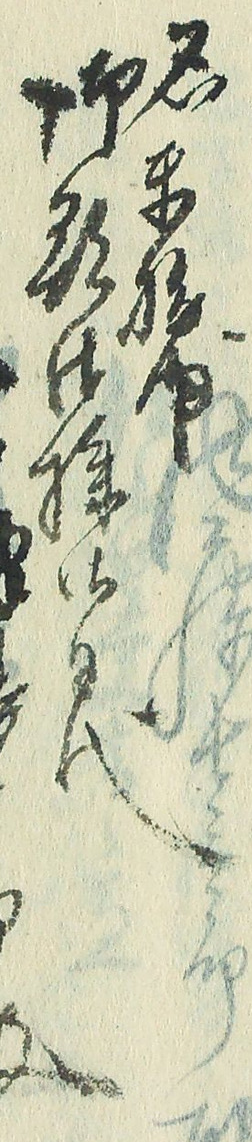御郡代様御手代
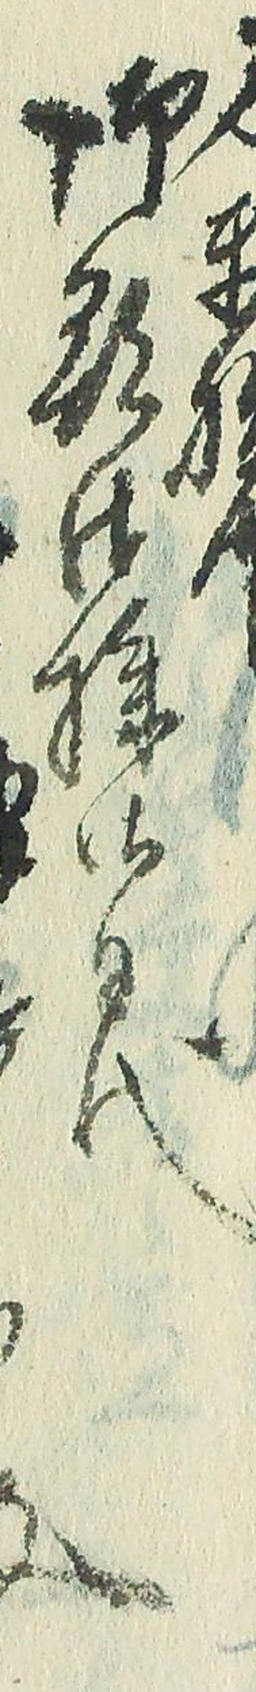御郡代様御手代
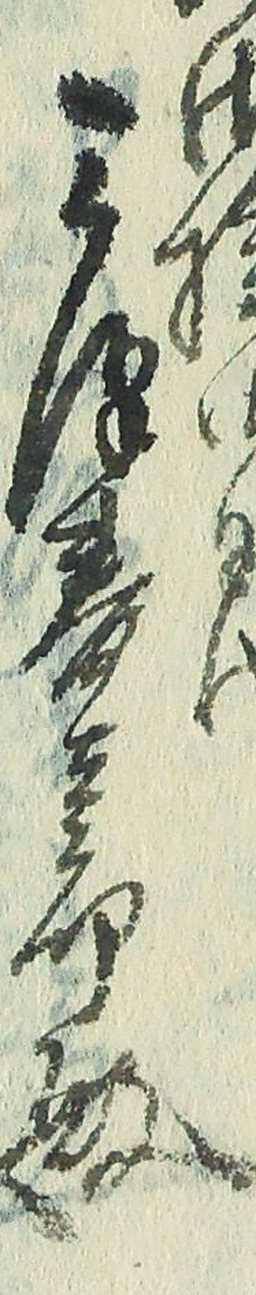三沢春太郎殿
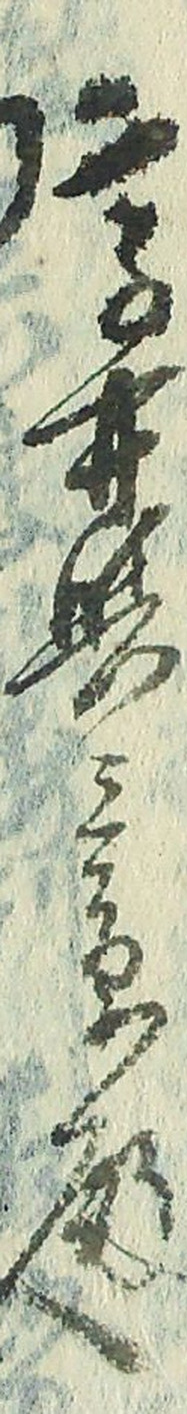高井与三兵衛殿
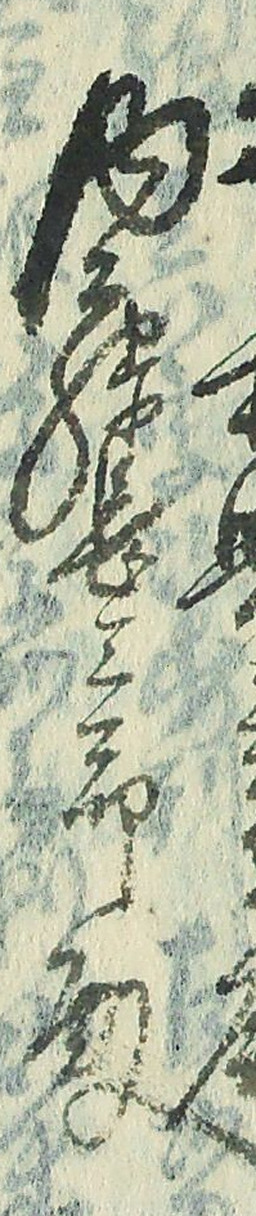内藤長三郎殿
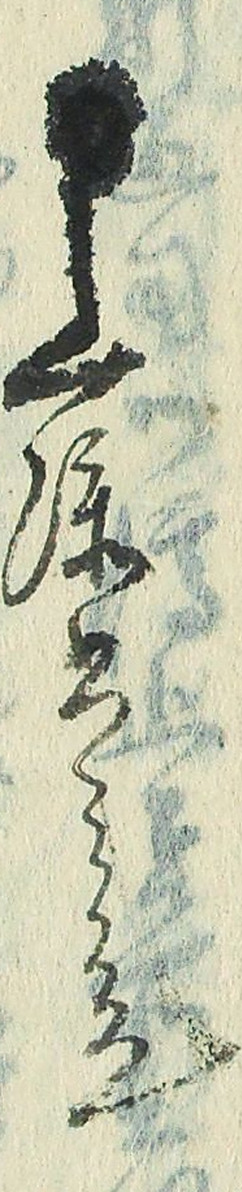申上添書之覚
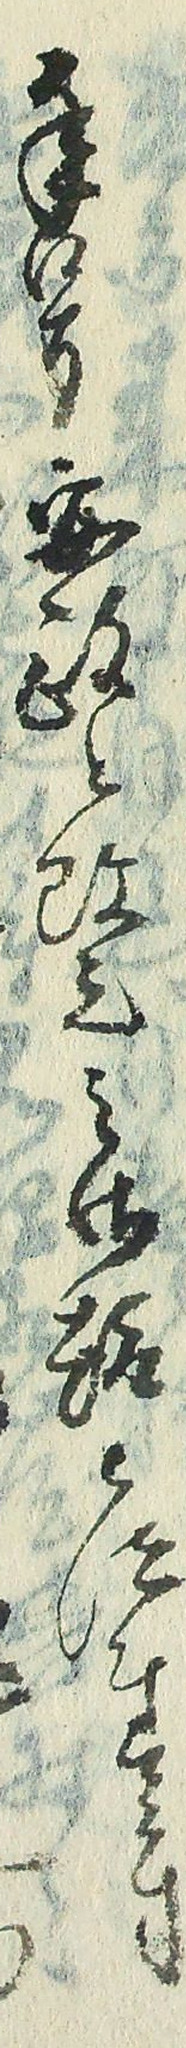年号安政と改元之御趣被仰付候に付
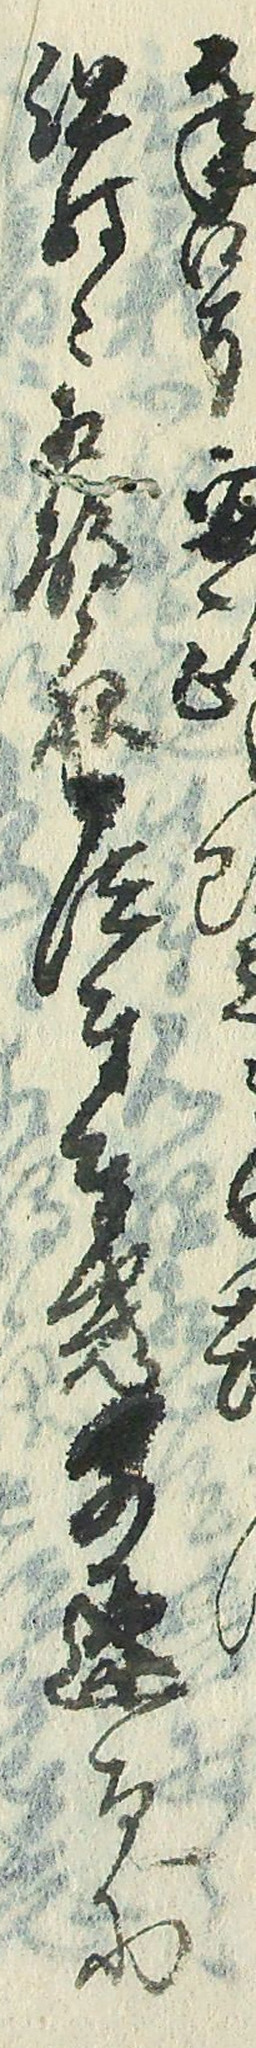組村々相触候様被仰付奉畏早速与村

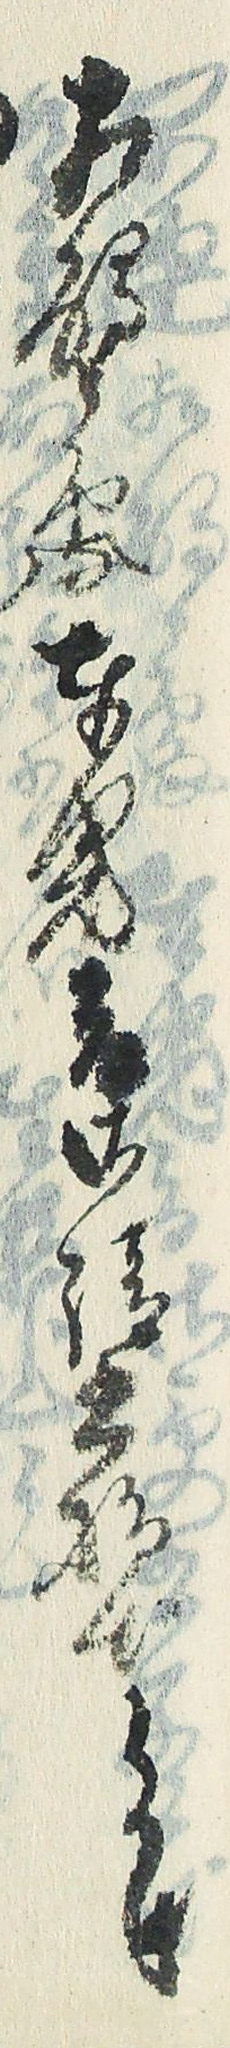相触候処奉畏旨御請書指出候に付
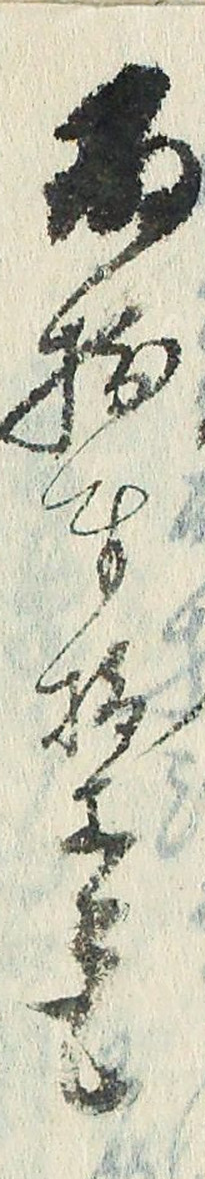取揃奉指上候以上
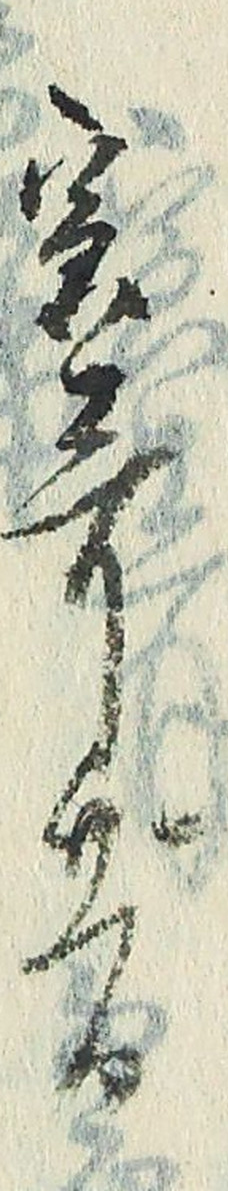寅十二月廿一日
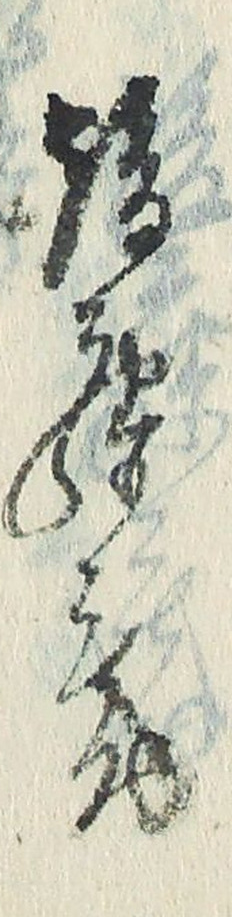後藤庄助
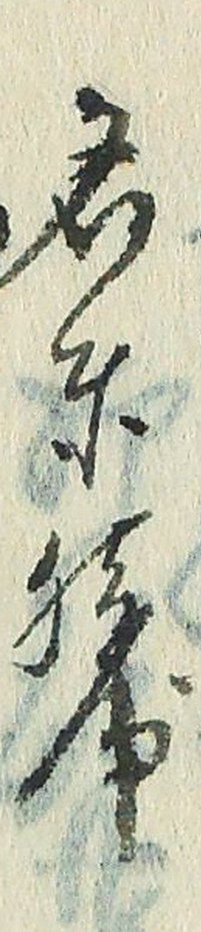名東勝浦
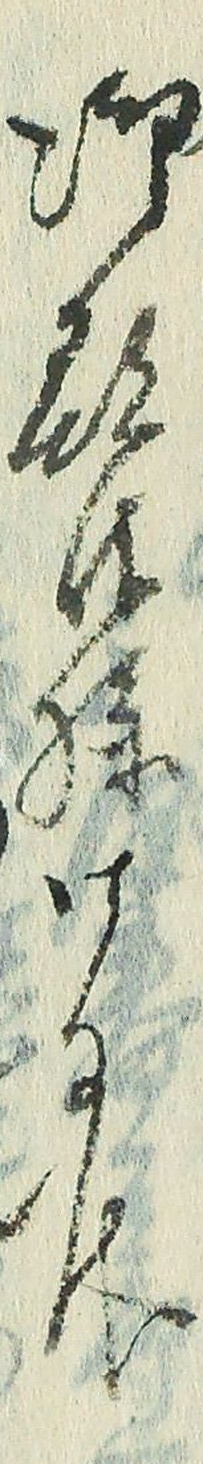御郡代様御手代
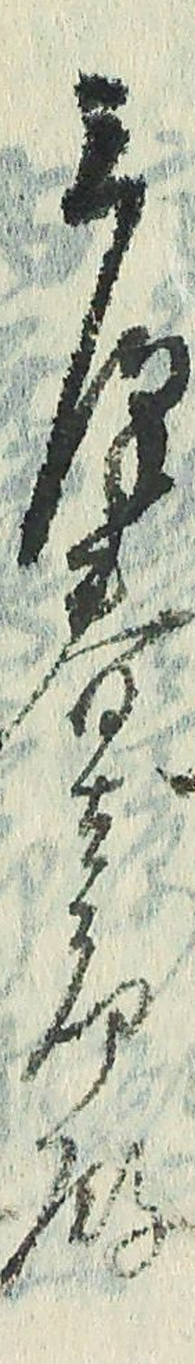三沢春太郎殿
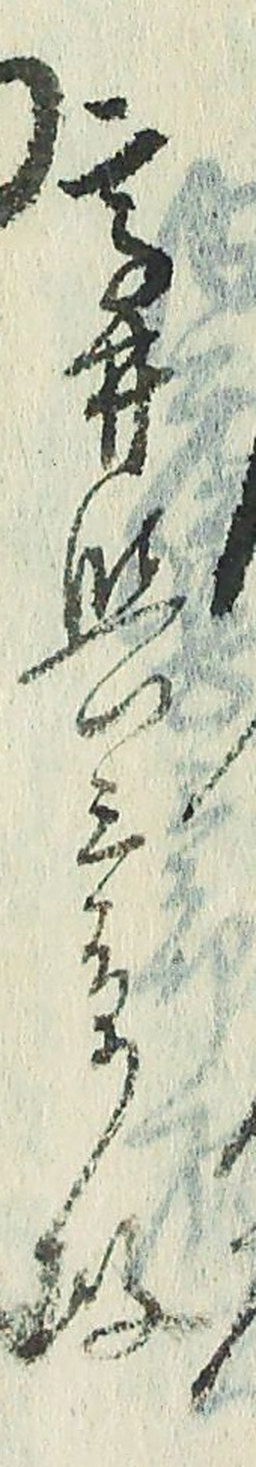高井与三兵衛殿
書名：諸御用御□受書控
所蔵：鳴門教育大学 Naruto University of Education
